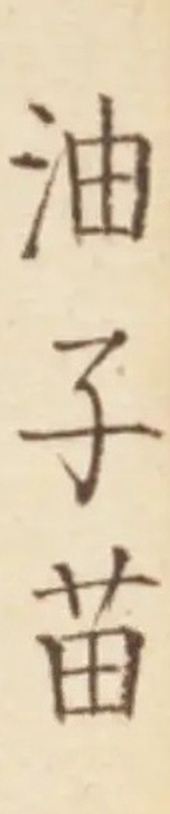油子苗
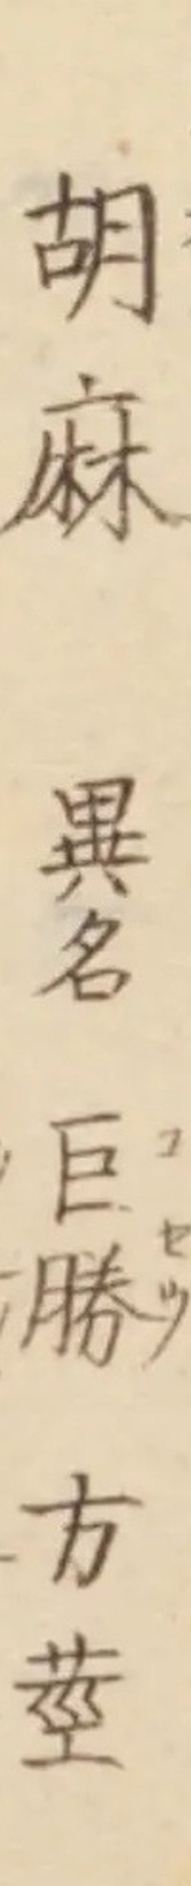胡麻異名巨勝方茎
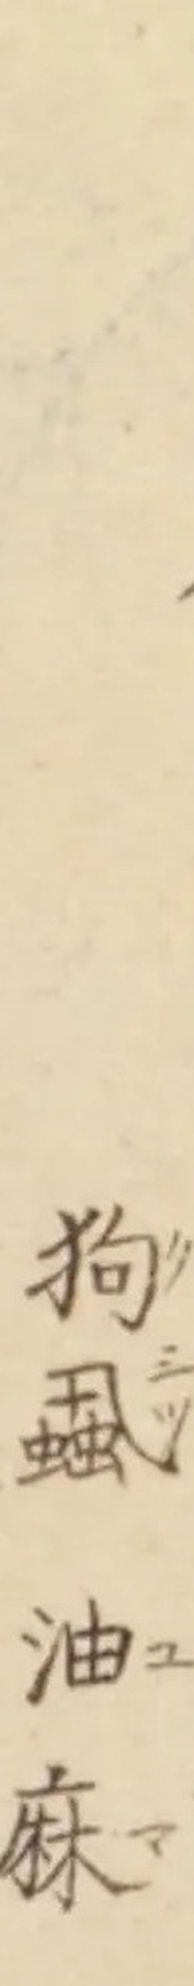狗蝨油麻
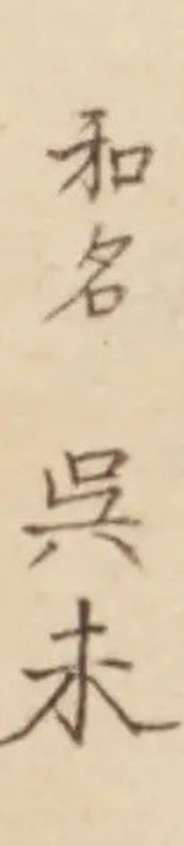和名呉未
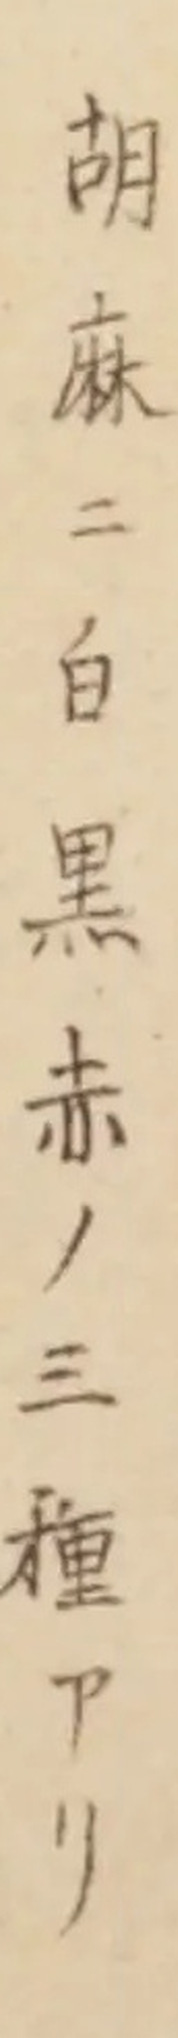胡麻ニ白黒赤ノ三種アリ
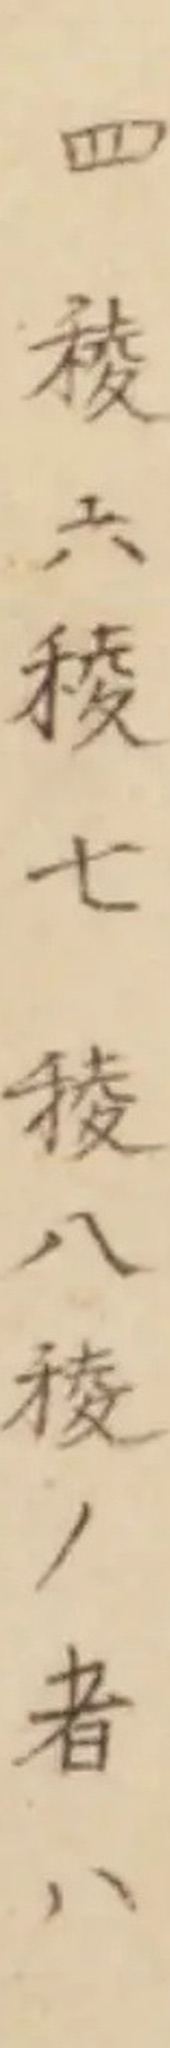四稜六稜七稜八稜ノ者ハ

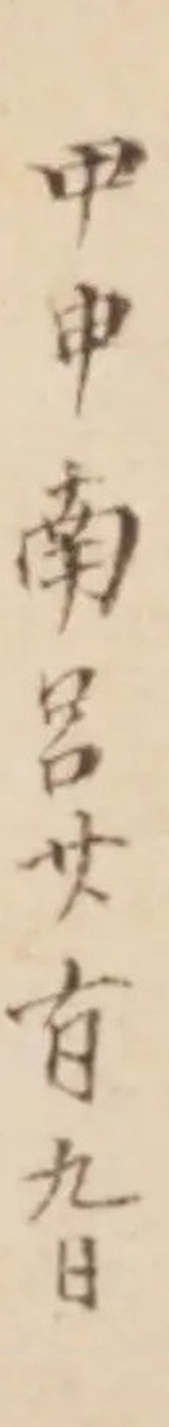甲申南呂廿有九日
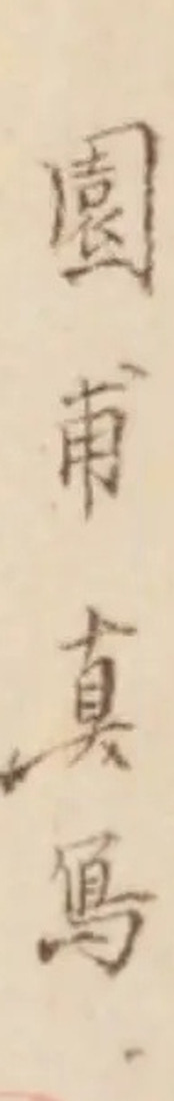園甫真写
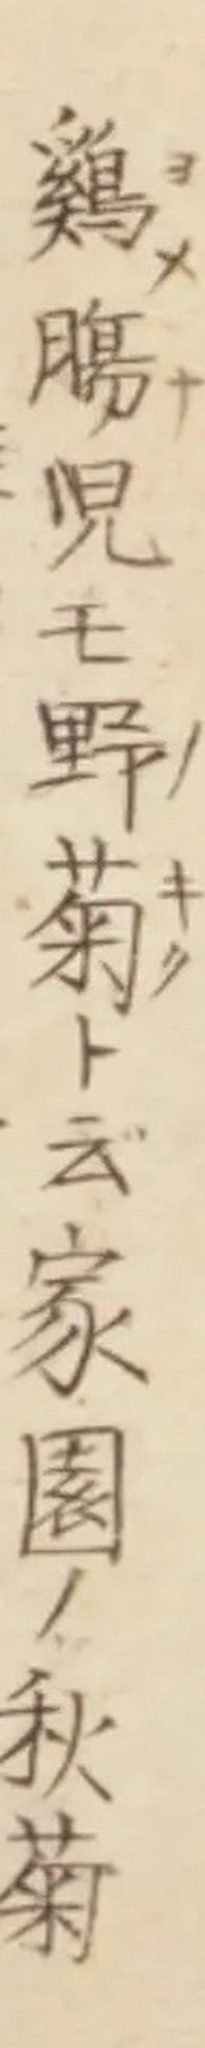鶏腸児モ野菊ト云家園ノ秋菊
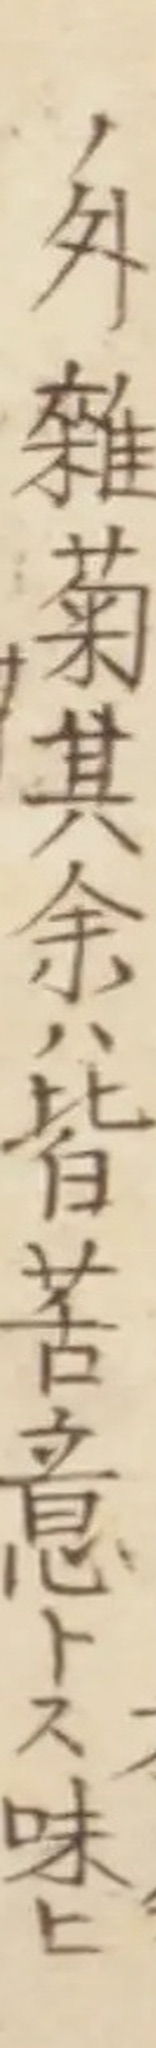ノ外雑菊其余ハ皆䒷意トス味ヒ
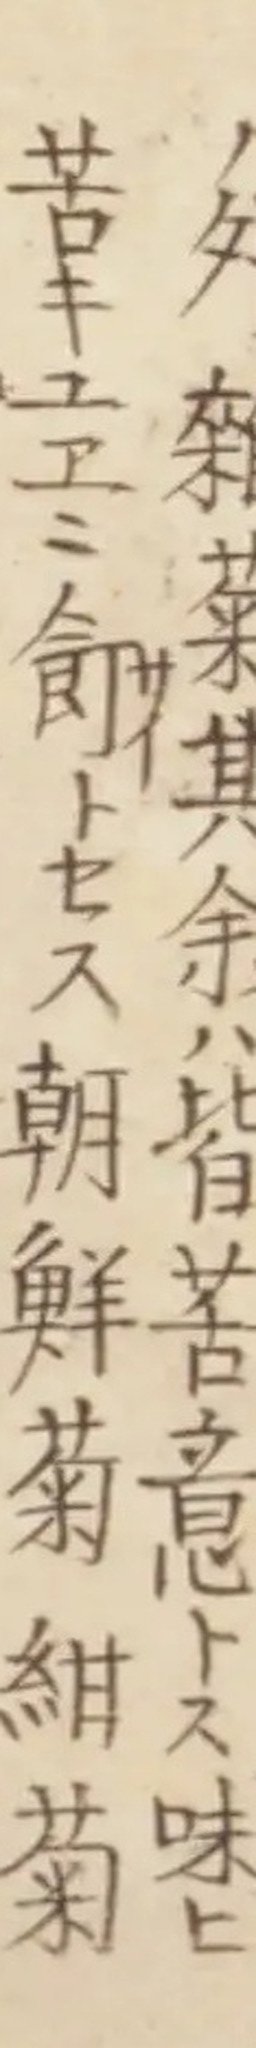苦キユヱニ飣トセス朝鮮菊紺菊
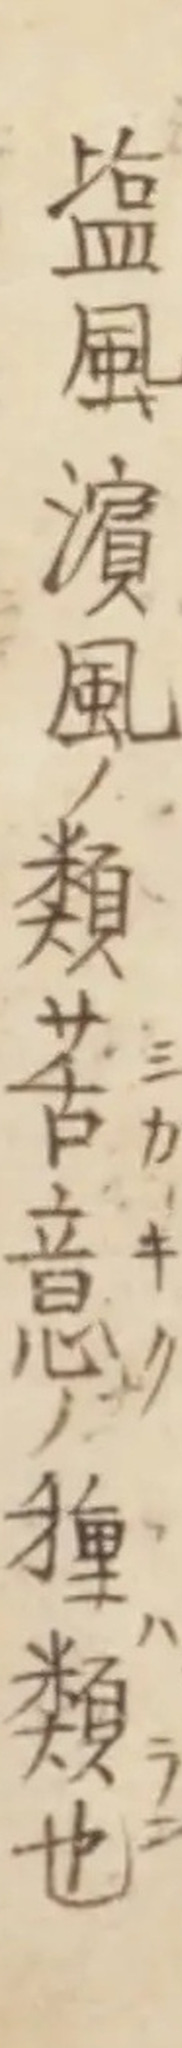塩風浜風ノ類䒷意ノ種類也
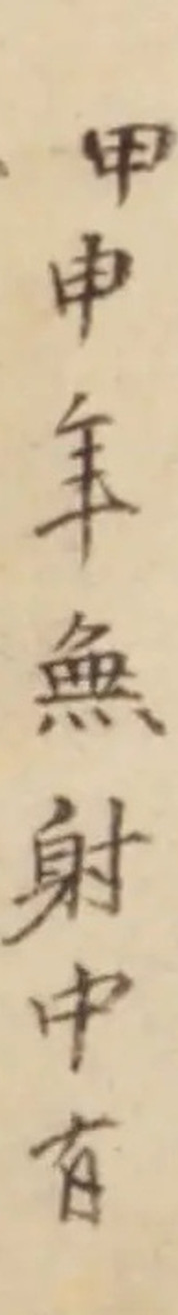甲申年無射中有
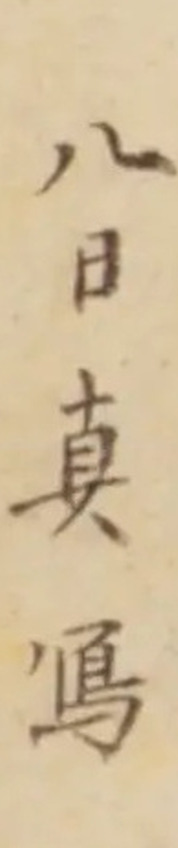八日真写

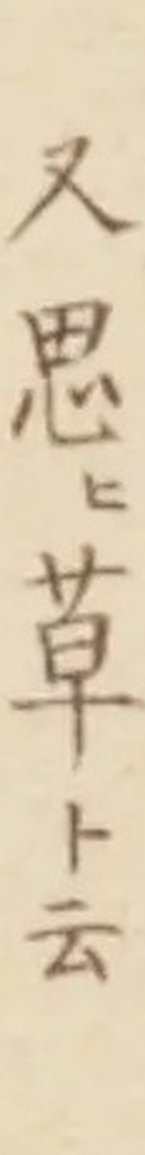又思草ト云

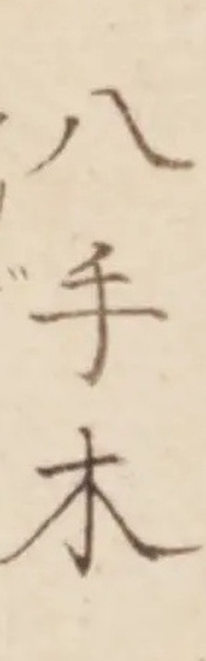八手木
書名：梅園草木花譜秋之部. 2
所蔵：国立国会図書館 National Diet Library, JAPAN
